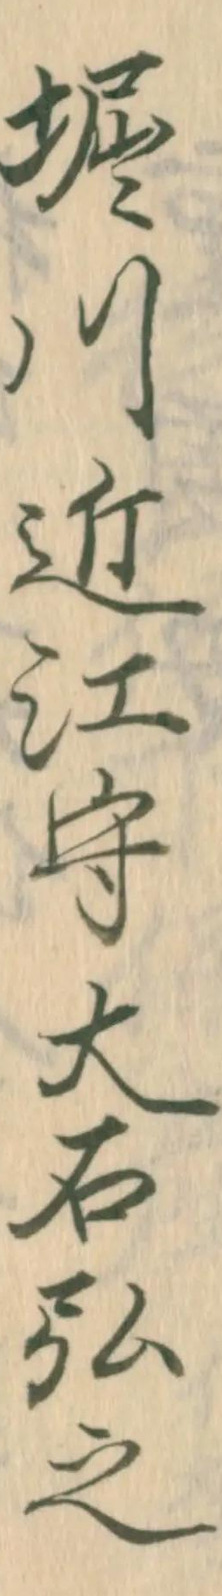堀川近江守大石弘之
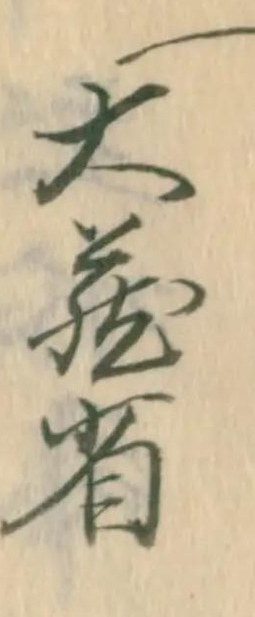大蔵省
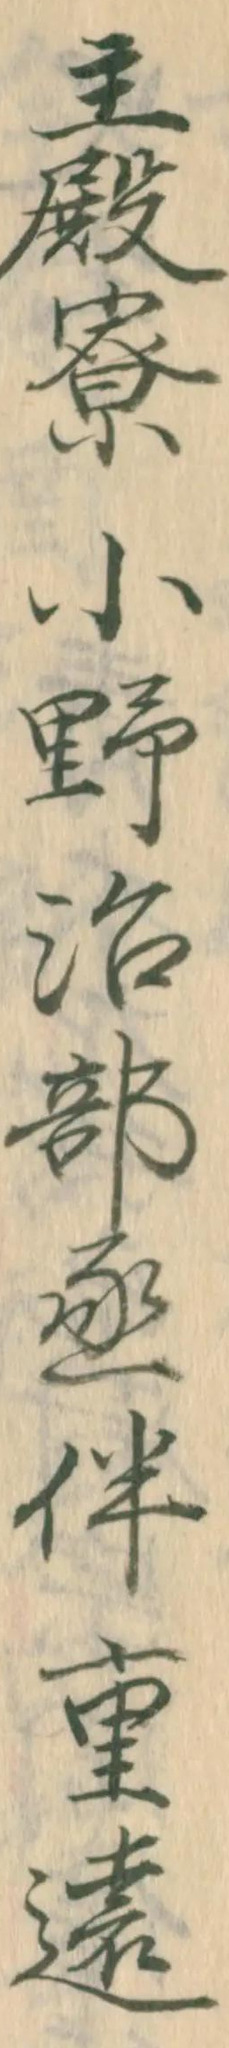主殿寮小野治部丞伴重遠
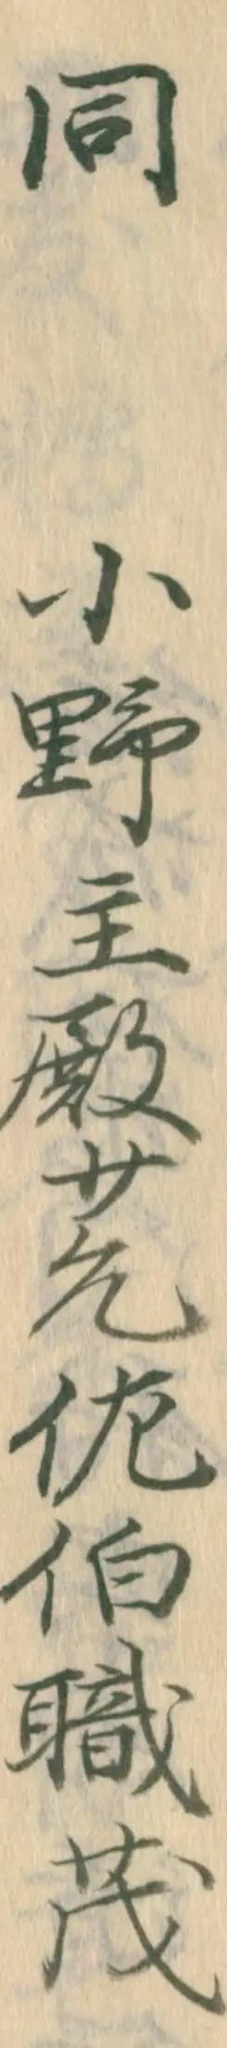同小野主殿少允佐伯職茂
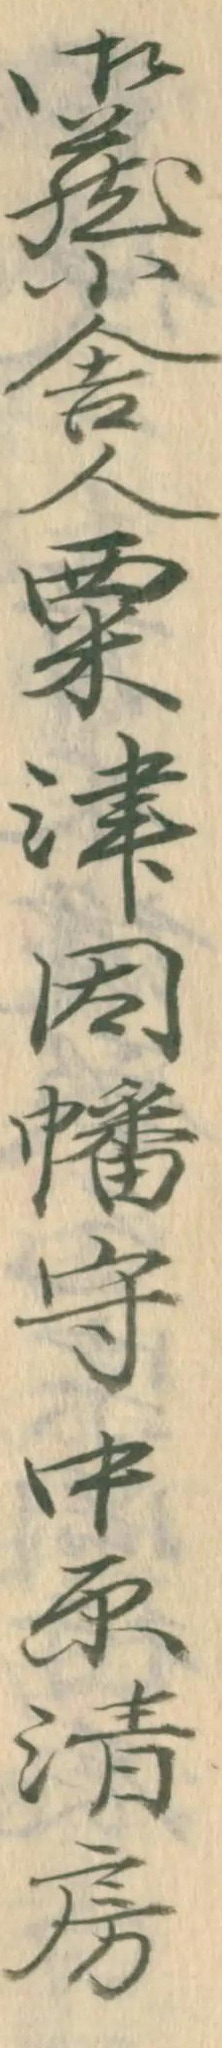御蔵小舎人粟津因幡守中原清房
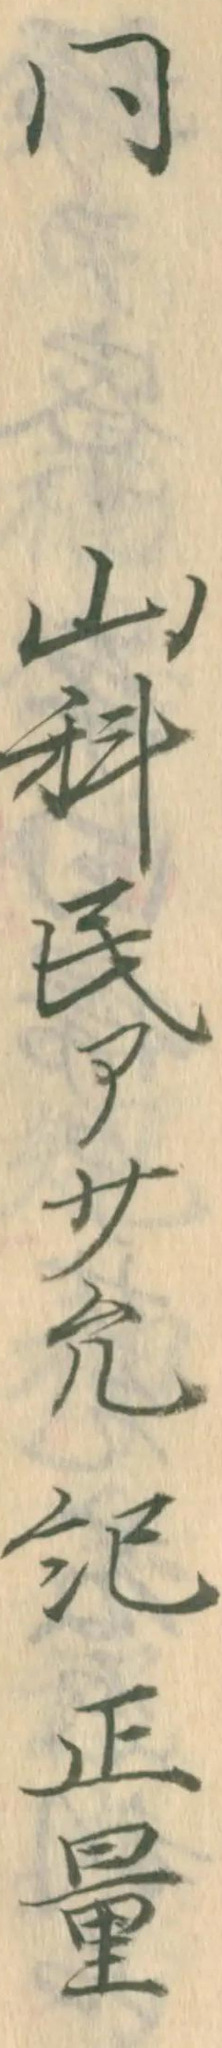同山科民部少允紀正量
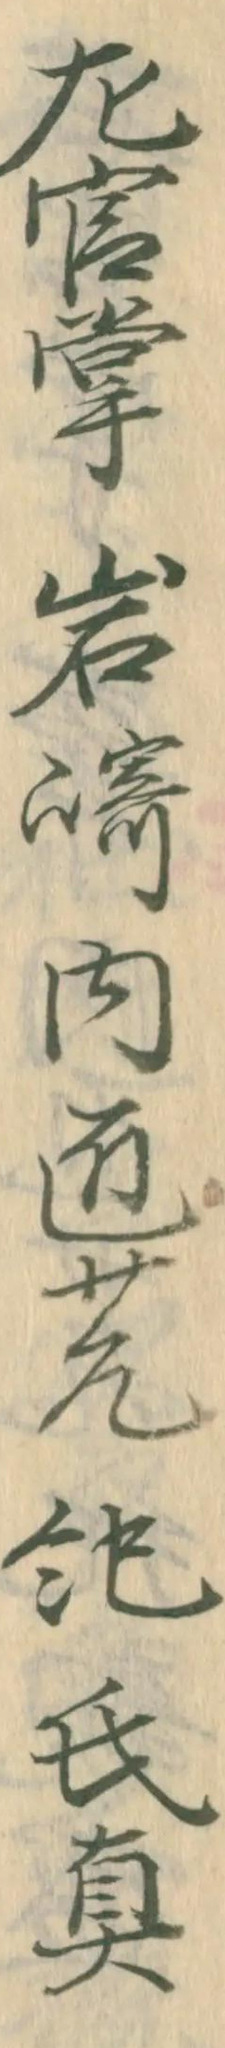左官掌岩崎内匠少允紀氏真

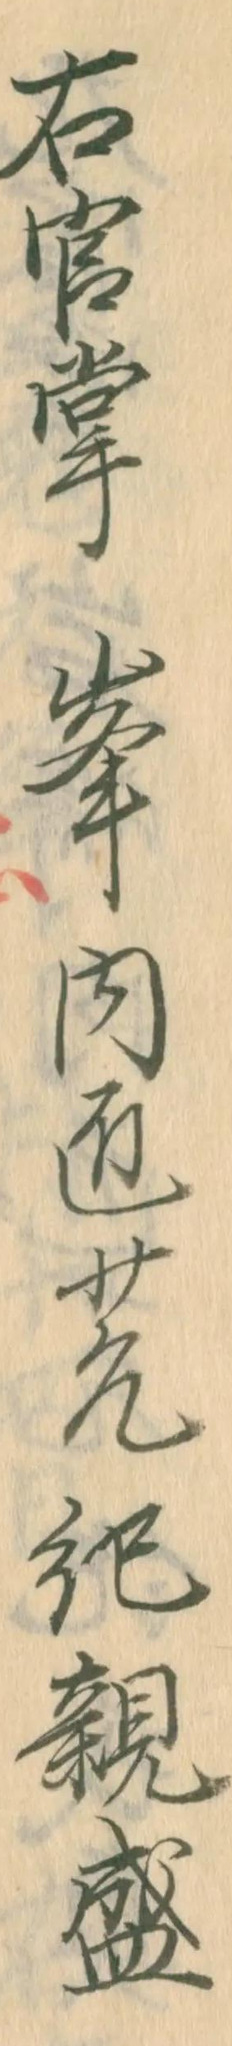右官掌峯内匠少允紀親盛
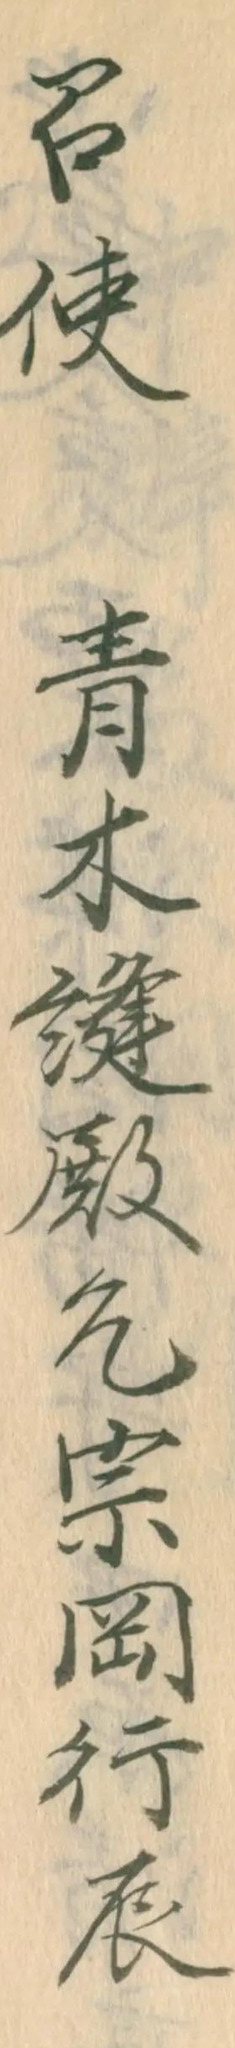召使青木縫殿允宗岡行辰
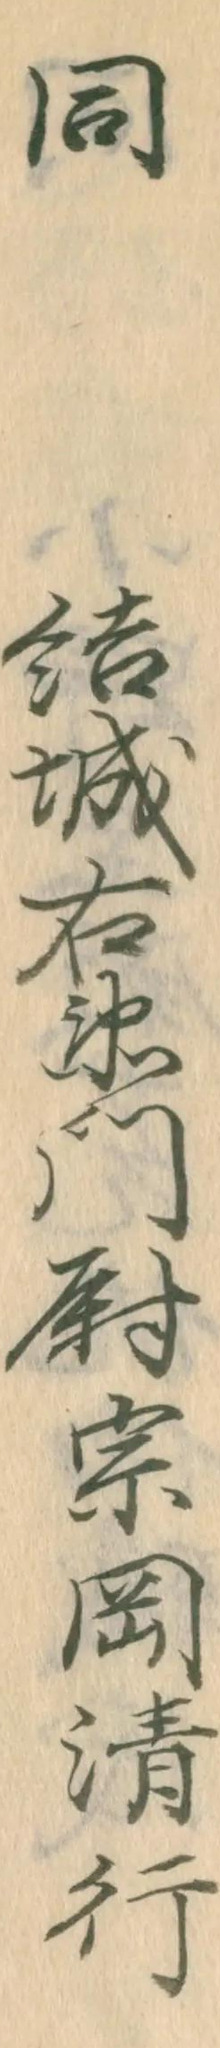同結城右衛門尉宗岡清行
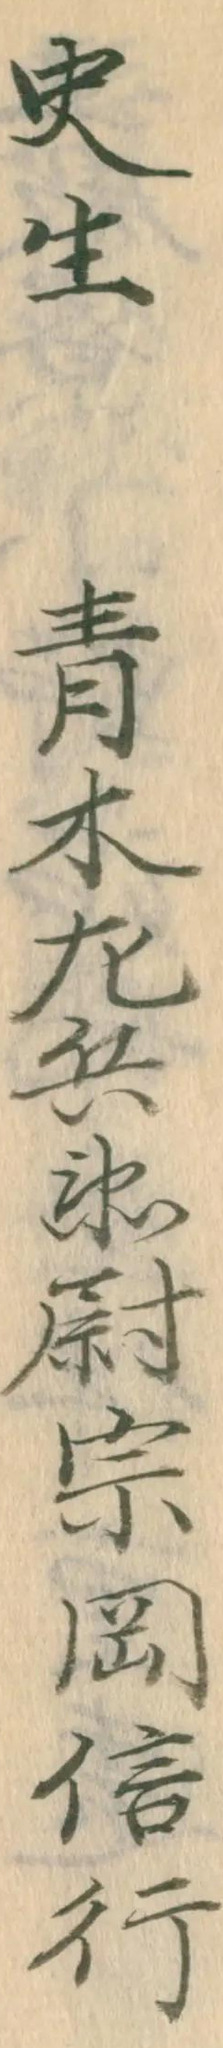史生青木左兵衛尉宗岡信行
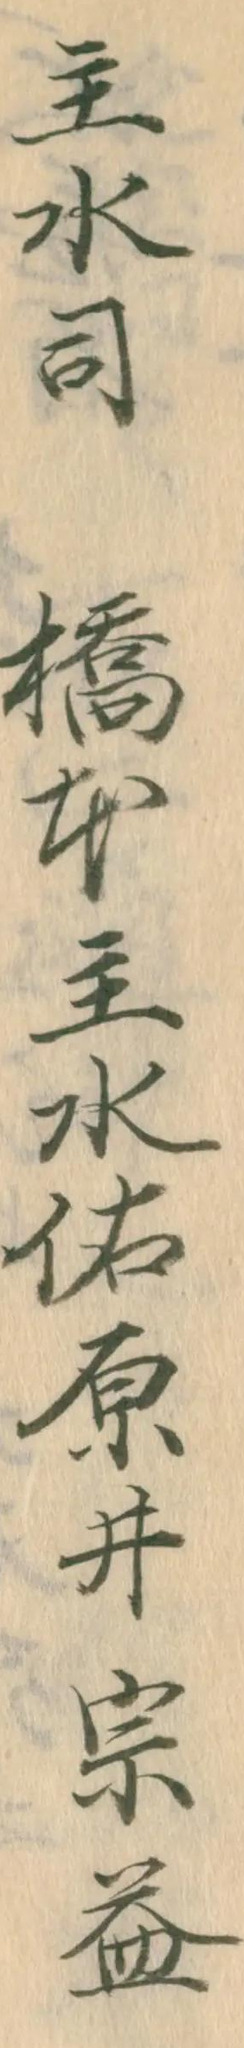主水司橋本主水佑原井宗益
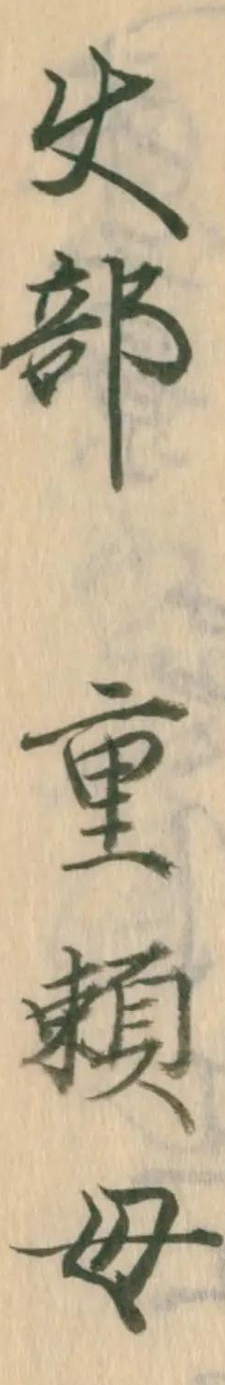使部重頼母
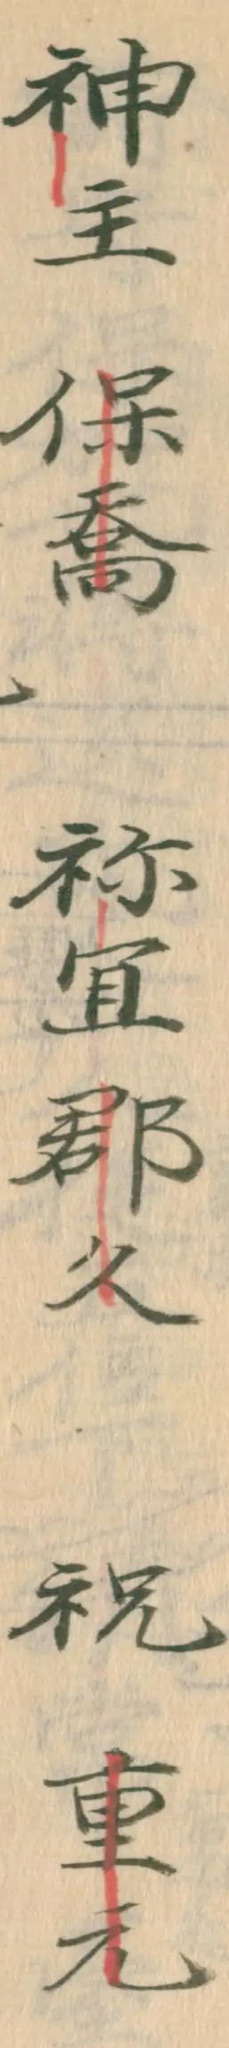神_主保喬祢-宜郡久祝重元
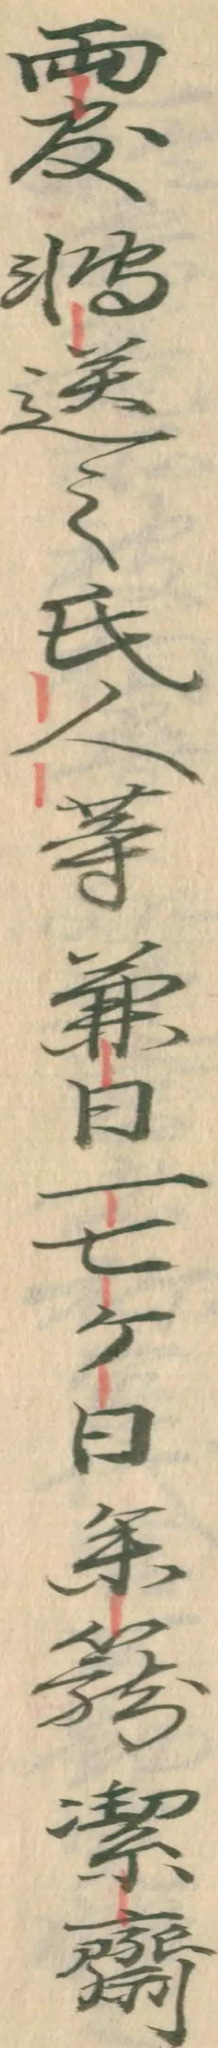両-官転-送之氏_等兼-日一-七-ケ-日参-籠潔-齋
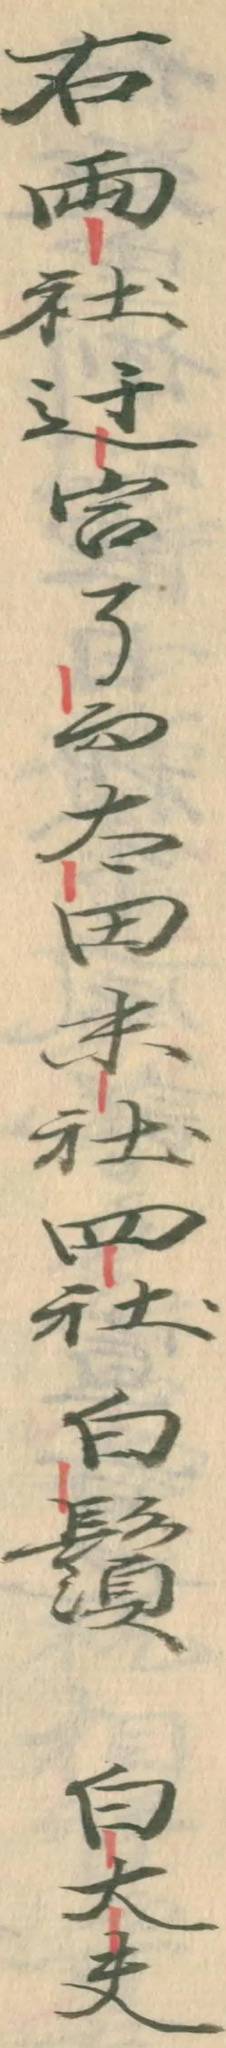右両-社迁-宮了_而太_田末-社四-社白_鬢白-太-夫
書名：賀茂社記録. 第16冊
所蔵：国立国会図書館 National Diet Library, JAPAN
